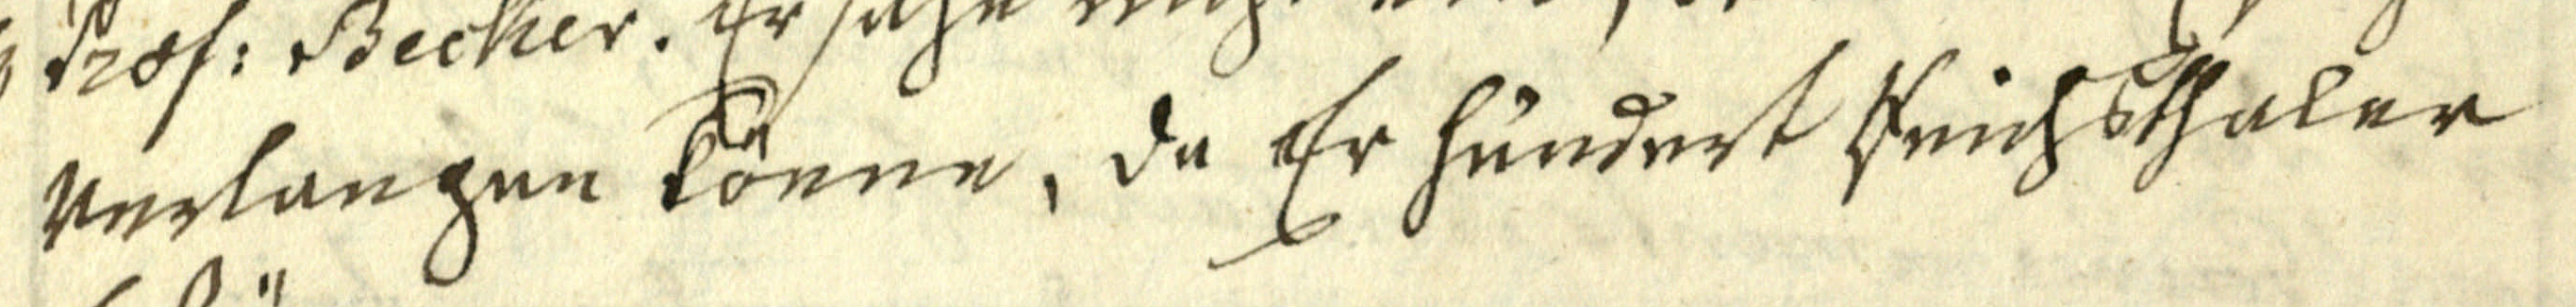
verlangen könne, da Er hundert Reichsthaler
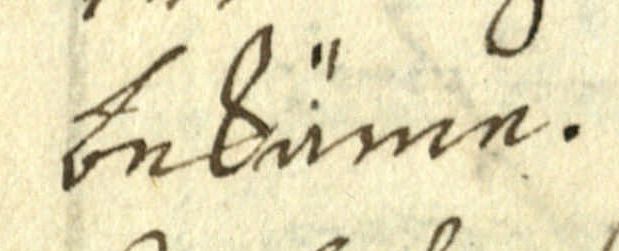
bekäme.
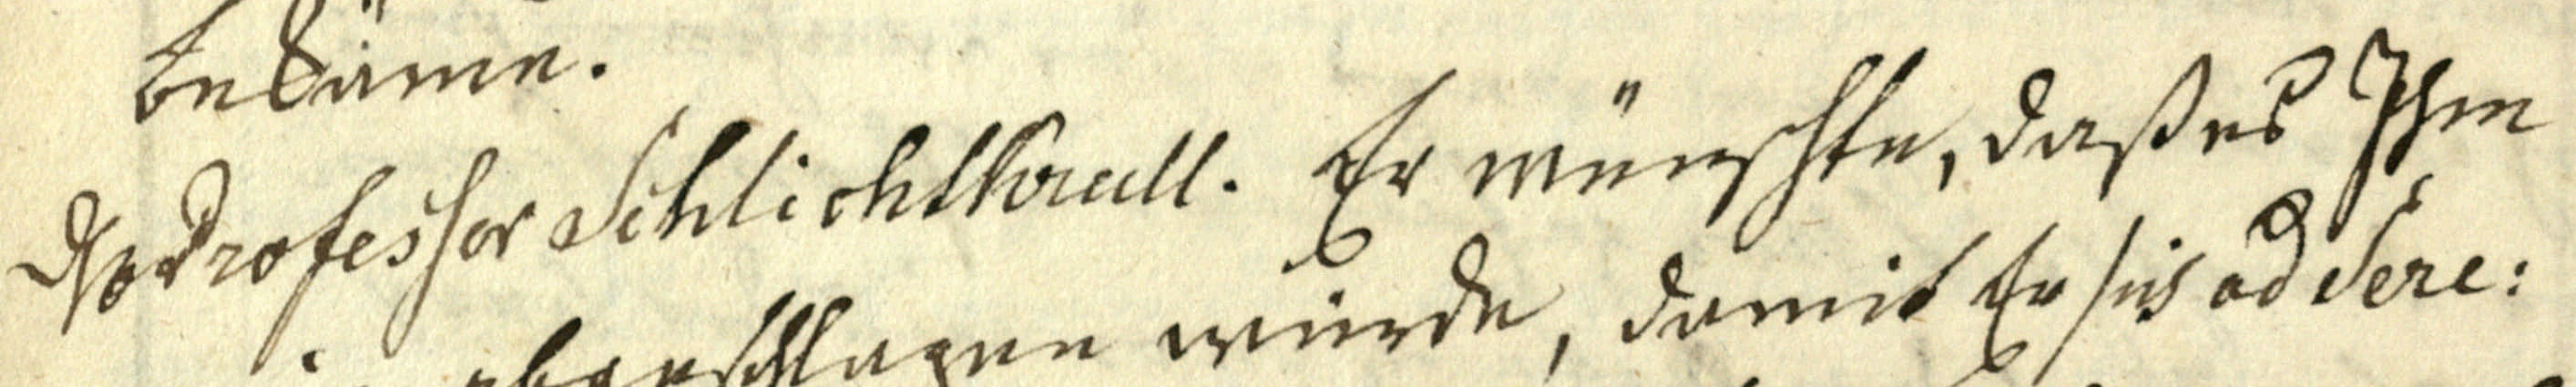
dh Professor Schlichtkrull. Er wünschte, daß es Ihm
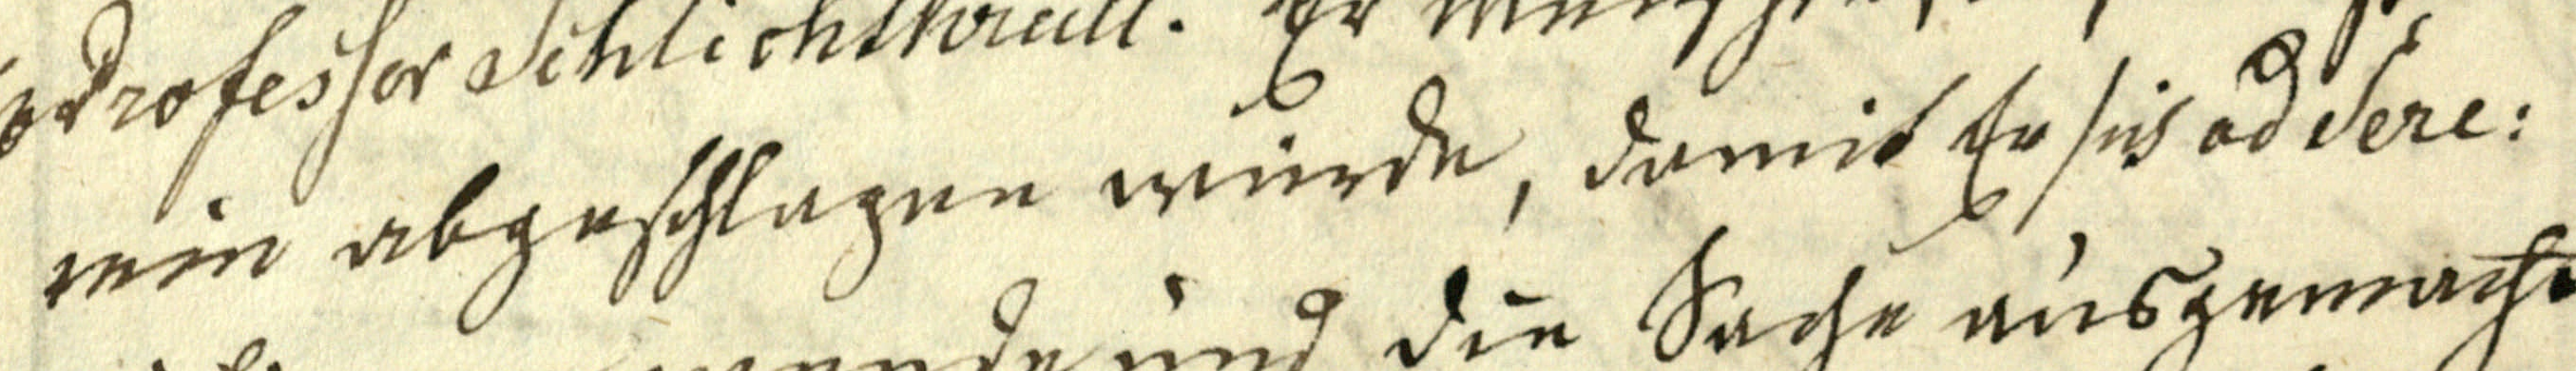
rein abgeschlagen würde, damit Er sich ad Sere¬
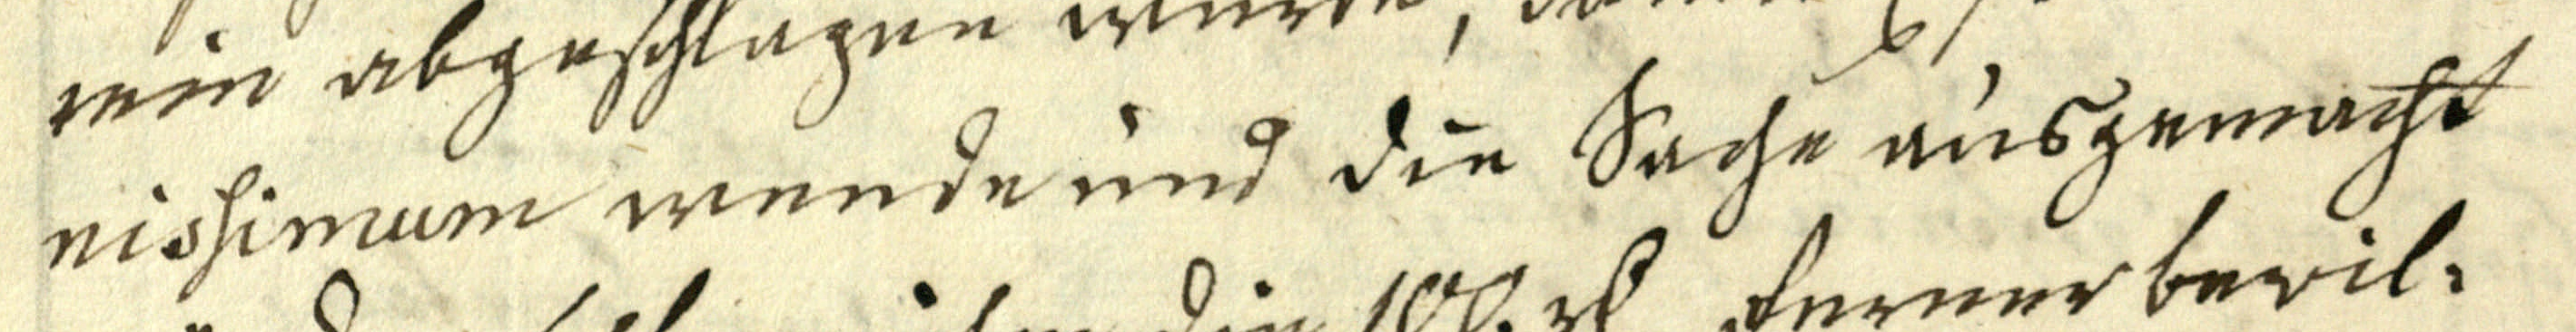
nissimium wende und die Sache ausgemacht
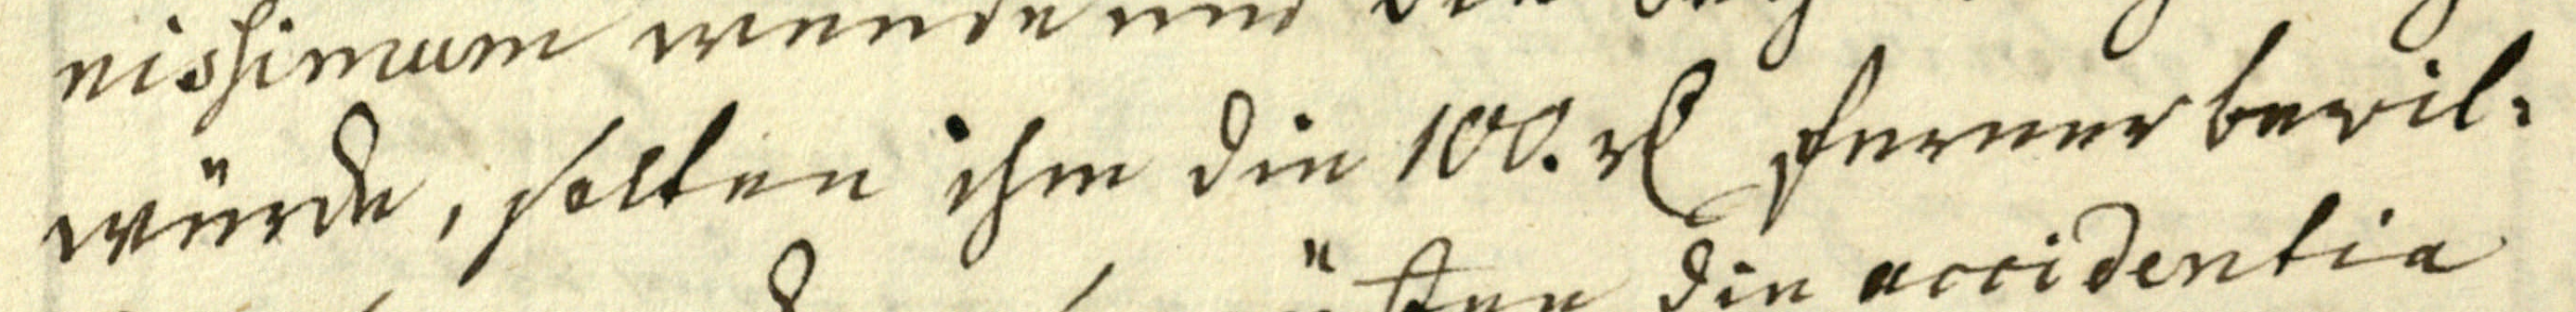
würde, solten ihm die 100. r ferner bewil¬
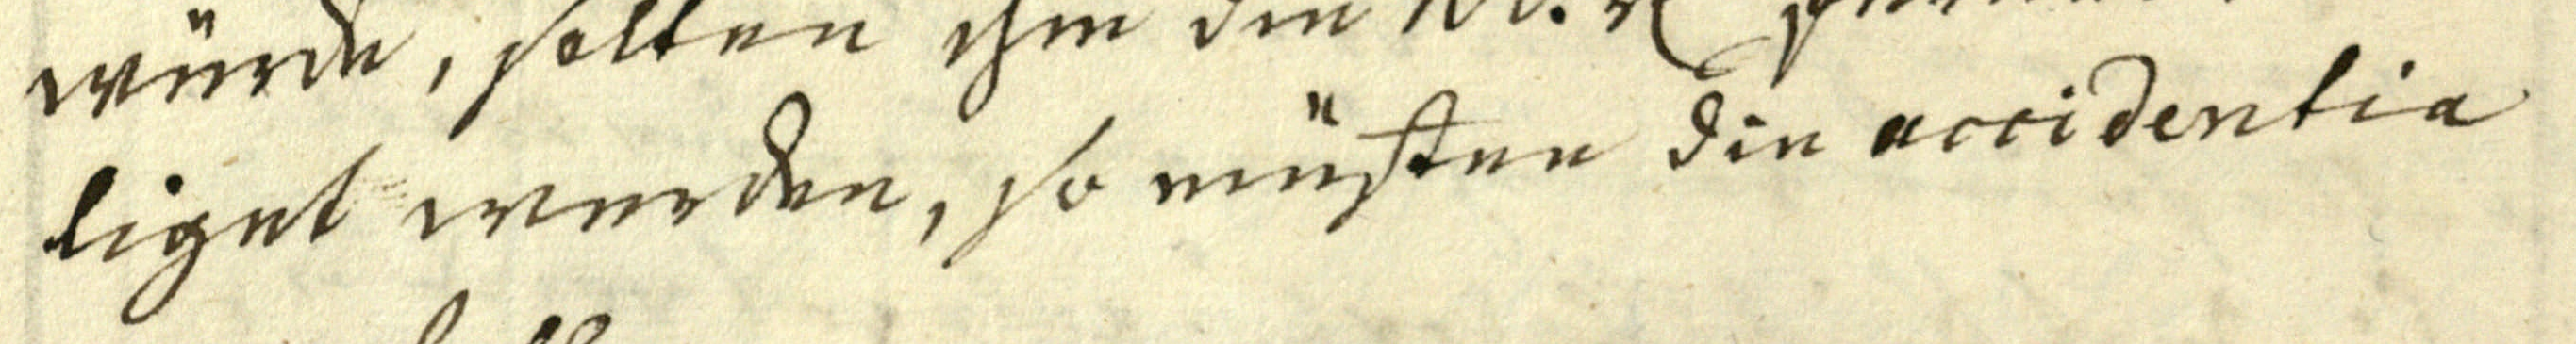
liget werden, so müsten die accidenitia
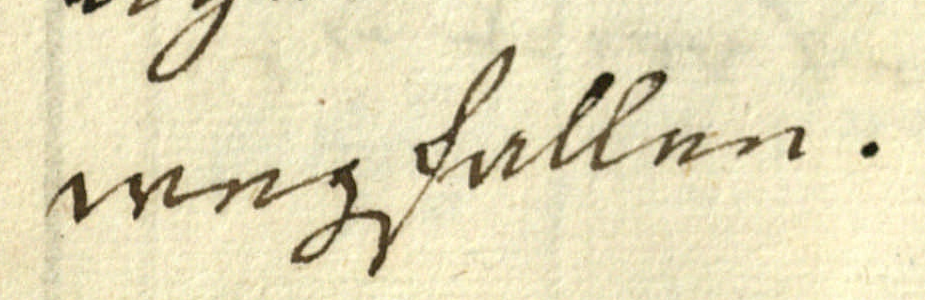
wegfallen.
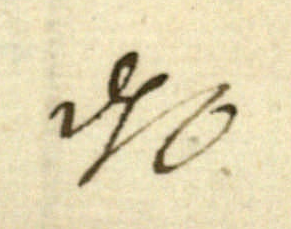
dh.
